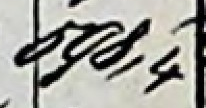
598,4
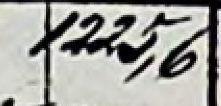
1225,6
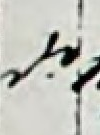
Do
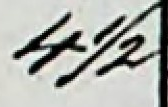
4 1/2
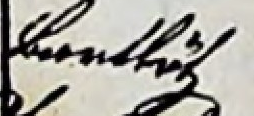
Bartlötz
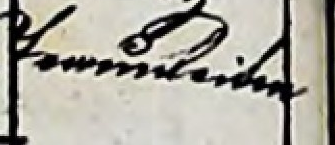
Traunleiten
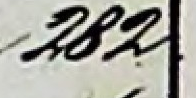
282
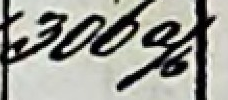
306 a/b
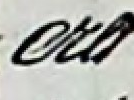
Alt
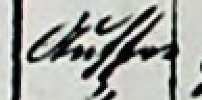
Aussee
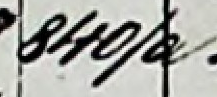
840/a
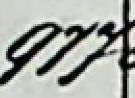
977
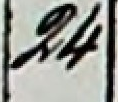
24
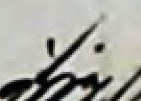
./.
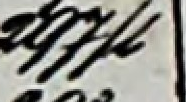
297/6
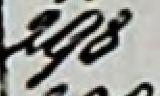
298
